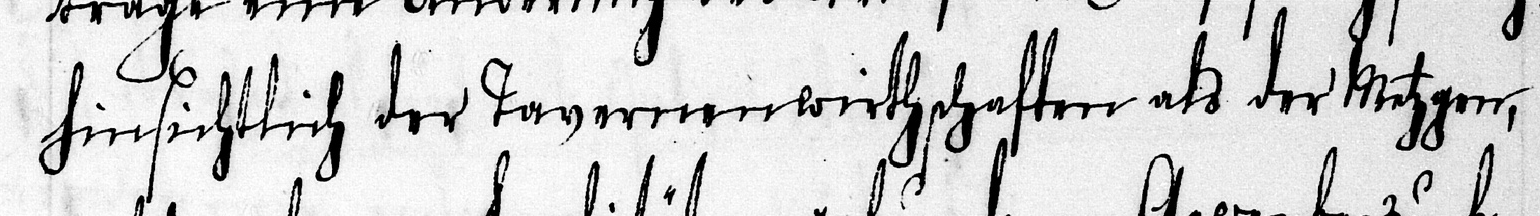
hinsichtlich der Tavernenwirthschaften als der Metzgen,
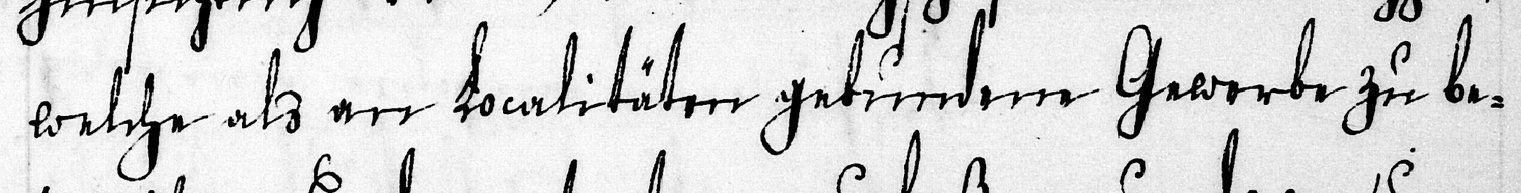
welche als an Localitäten gebundene Gewerbe zu be¬
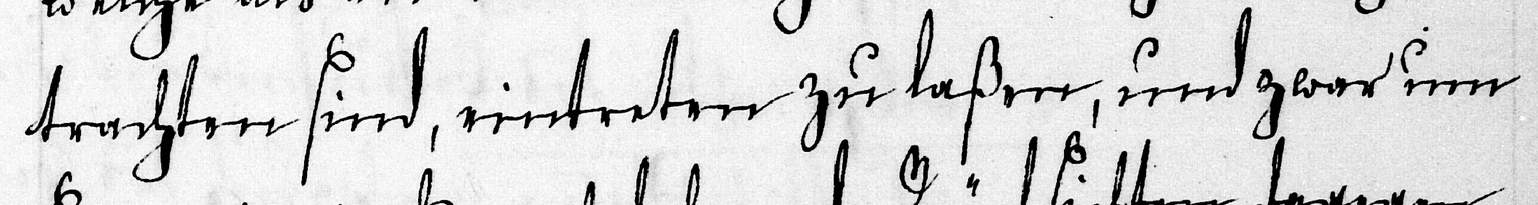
trachten sind, eintreten zu laßen, und zwar um
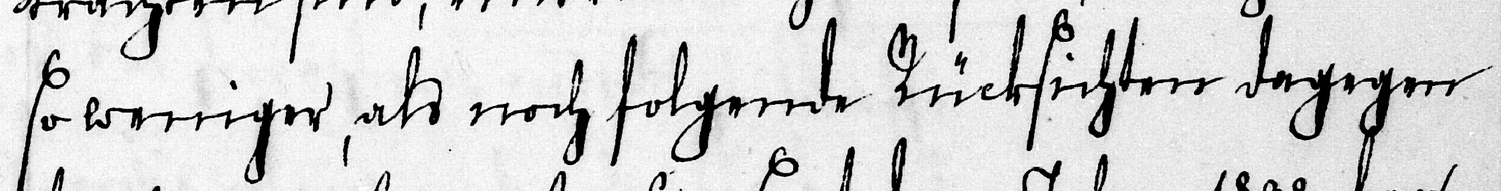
so weniger, als noch folgende Rücksichten dagegen
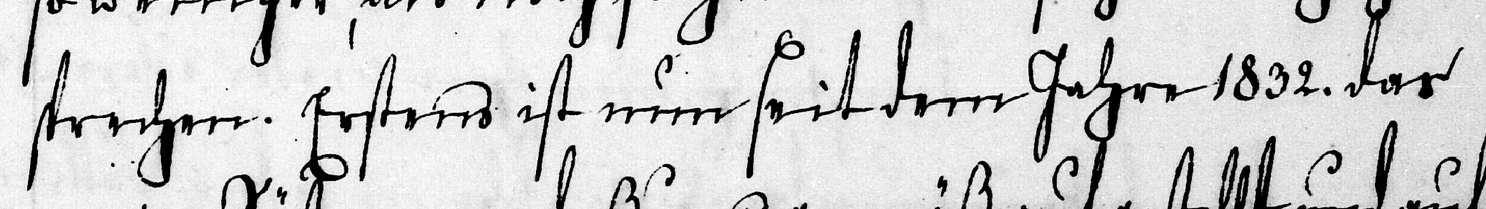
sprechen. Erstens ist nun seit dem Jahre 1832. das
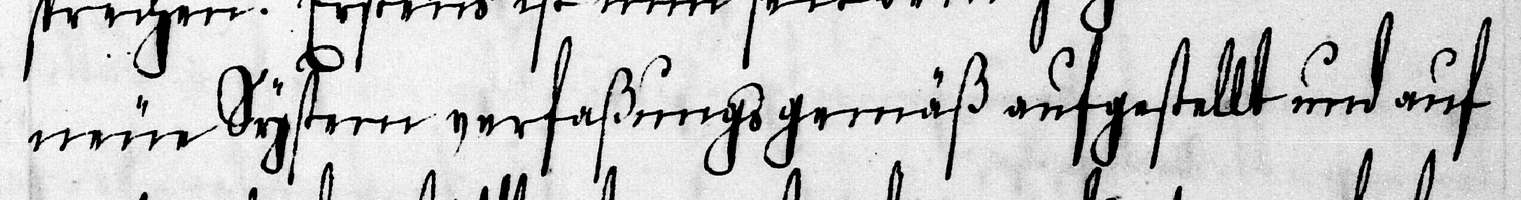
neue System verfaßungsgemäß aufgestellt und auf
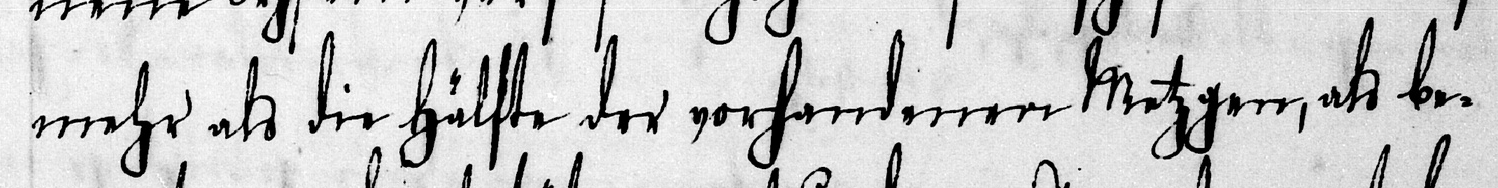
mehr als die Hälfte der vorhandenen Metzgen, als be¬
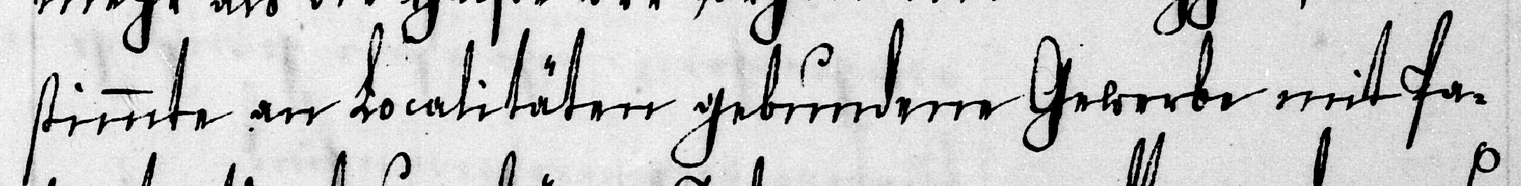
stimmte an Localitäten gebundene Gewerbe mit Pa¬
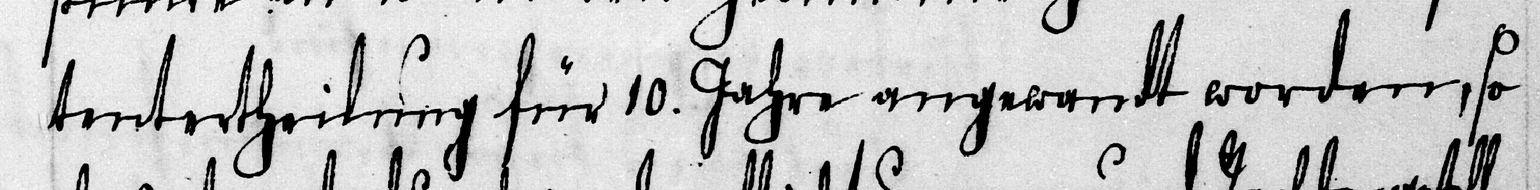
tentertheilung für 10. Jahre angewandt worden, so
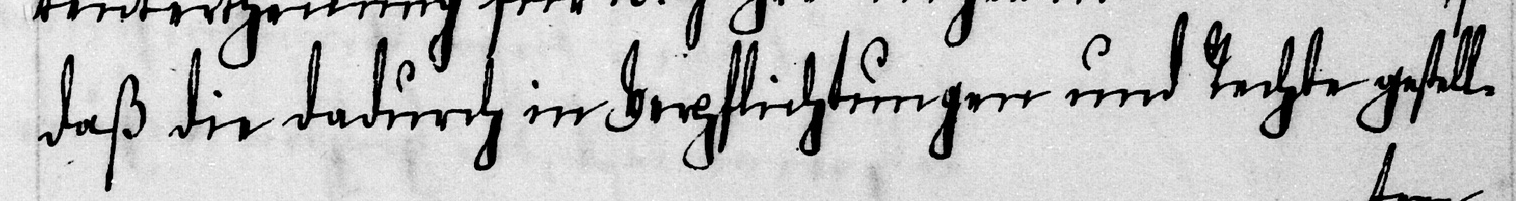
daß die dadurch in Verpflichtungen und Rechte gestel¬
